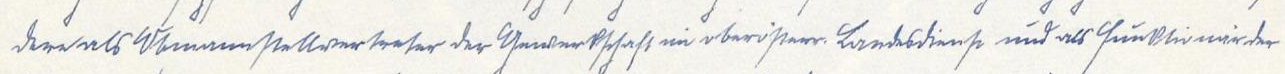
dere als Obmannstellvertreter der Gewerkschaft im oberösterr. Landesdienst und als Funktionär der
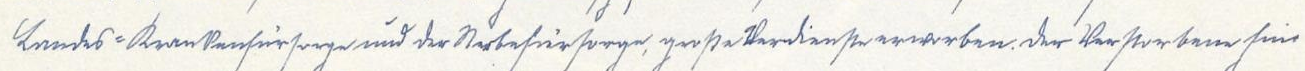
Landes - Krankenfürsorge und der Sterbefürsorge große Verdienste erworben. Der Verstorbene hin-
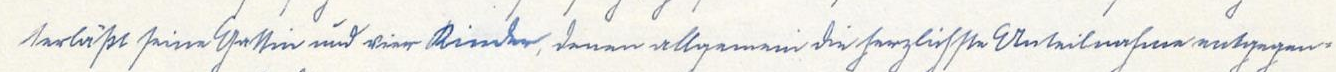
terlässt seine Gattin und vier Kinder, denen allgemein die herzlichste Anteilnahme entgegen-
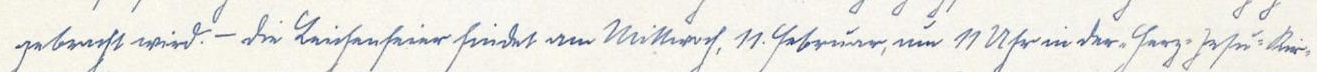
gebracht wird. - Die Leichenfeier findet am Mittwoch, 11. Februar, um 11 Uhr in der Herz - Jesu – Kir-
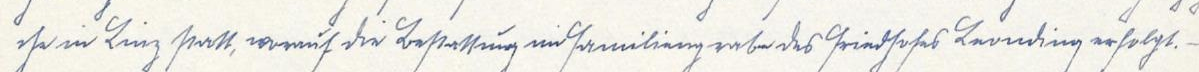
che in Linz statt, worauf die Bestattung im Familiengrabe des Friedhofs Leonding erfolgt. –
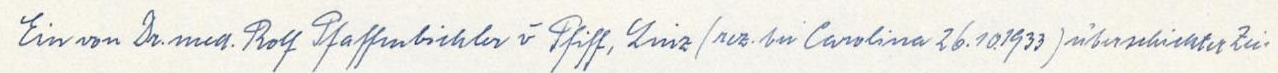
Ein von Dr. med. Rolf Pfaffenbichler v/o Pfiff, Linz (rez. bei Carolina 26.10.1933) überschickter Zei-
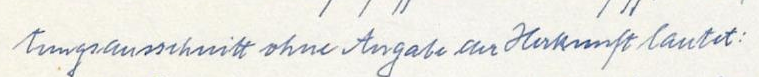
tungsausschnitte unter Angabe der Herkunft lautet:
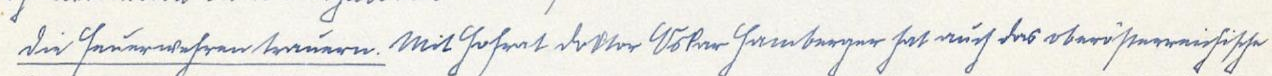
Die Feuerwehren trauern. Mit Hofrat Doktor Oskar Hamberger hat auch das oberösterreichische
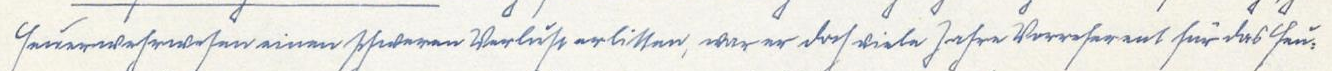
Feuerwehrwesen einen schweren Verlust erlitten, war er doch viele Jahre Vorreferent für das Feu-
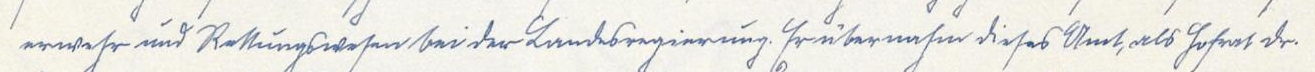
erwehr und Rettungswesen bei der Landesregierung. Er übernahm dieses Amt, als Hofrat Dr.
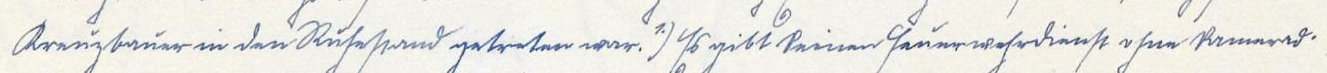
Kreuzbauer in den Ruhestand getreten war. 1) Es gibt keinen Feuerwehrdienst ohne Kamerad-
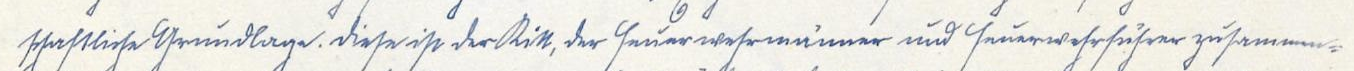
schaftliche Grundlage. Diese ist der Kitt, der Feuerwehrmänner und Feuerwehführer zusammen-
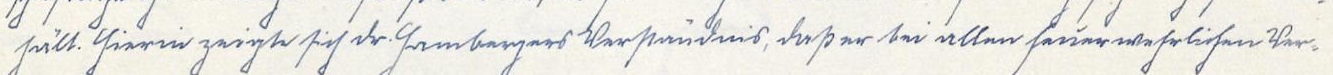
hält. Hierin zeigte sich Dr. Hambergers Verständnis, dass er bei allen feuerwehrlichen Ver-
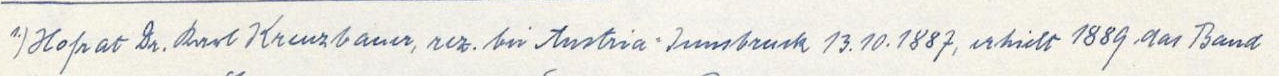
1) Hofrat Dr. Kurt Kranzbauer, rez. bei Austria - Innsbruck 13.10.1887, erhielt 1889 das Band
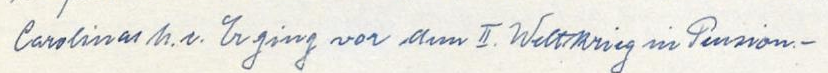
Carolinas h.c. Er ging vor dem II. Weltkrieg in Pension.
